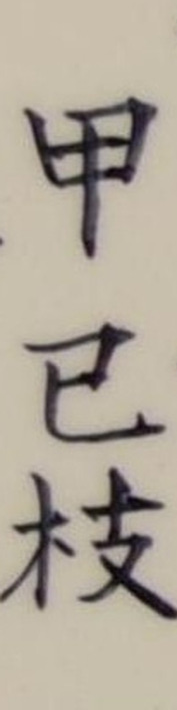甲巳枝
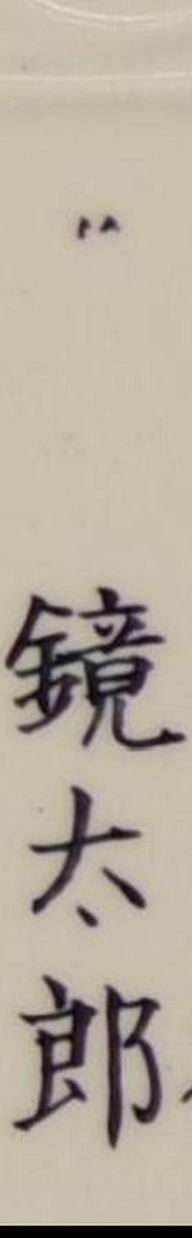鏡太郎
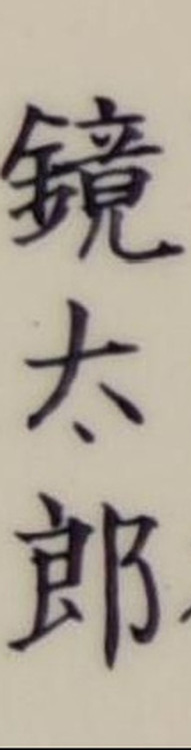鏡太郎
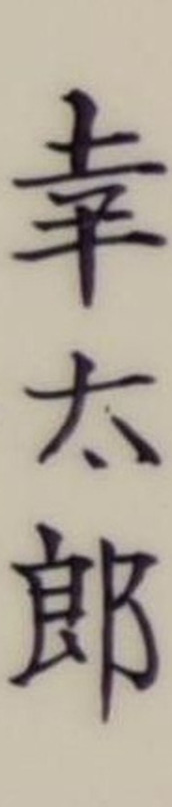幸太郎

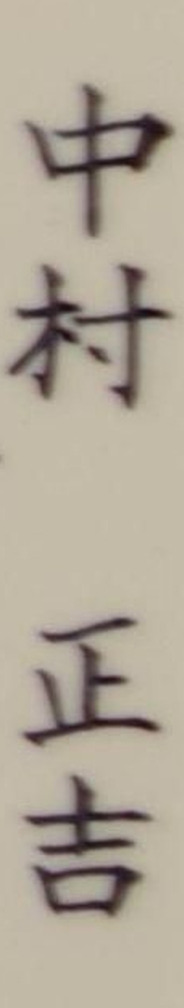中村正吉
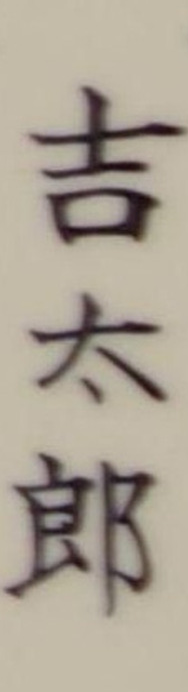吉太郎
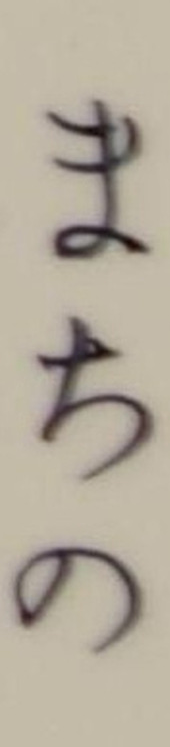まちの
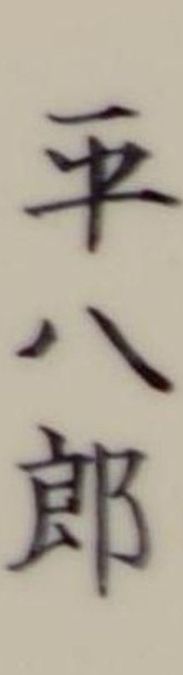平八郎
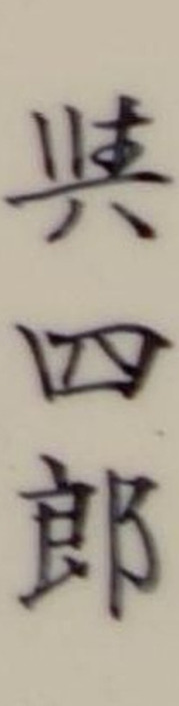与四郎
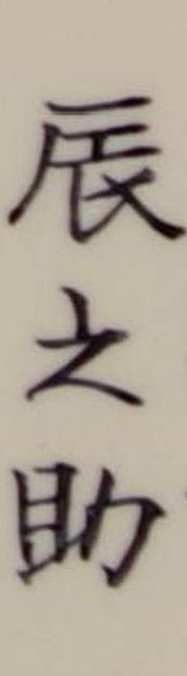辰之助
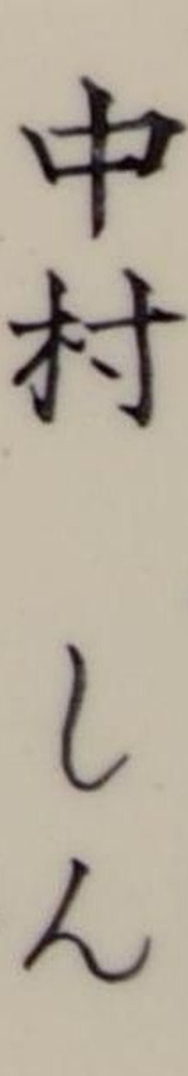中村しん
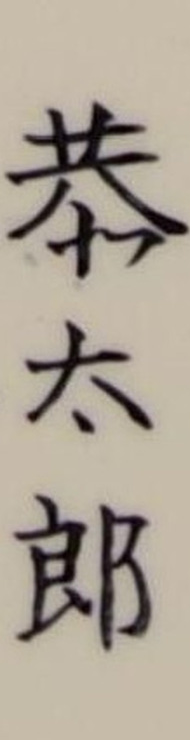恭太郎
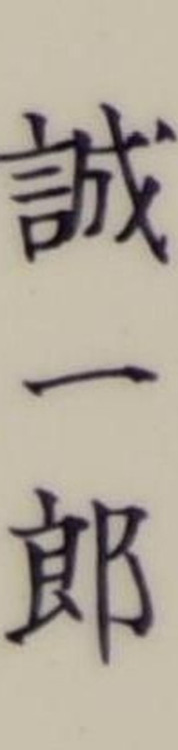誠一郎
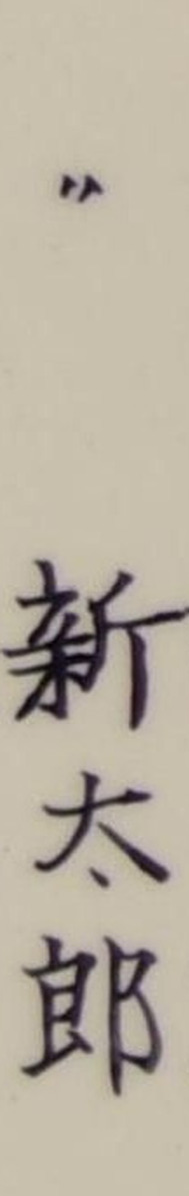新太郎
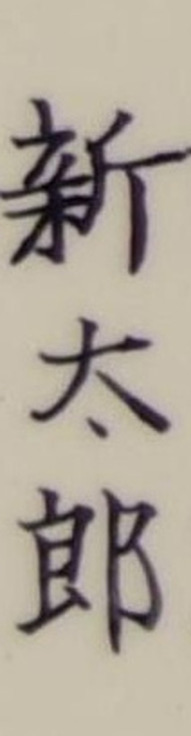新太郎
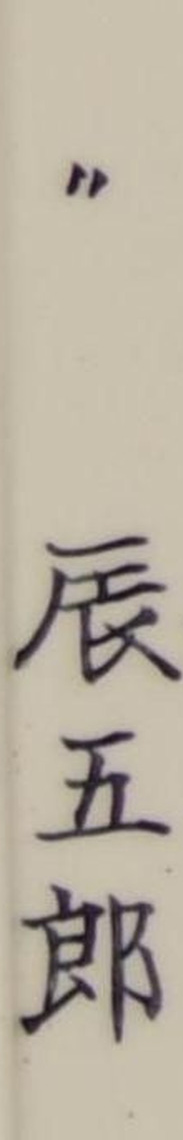辰五郎
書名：E~L
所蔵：高野山金剛峯寺
